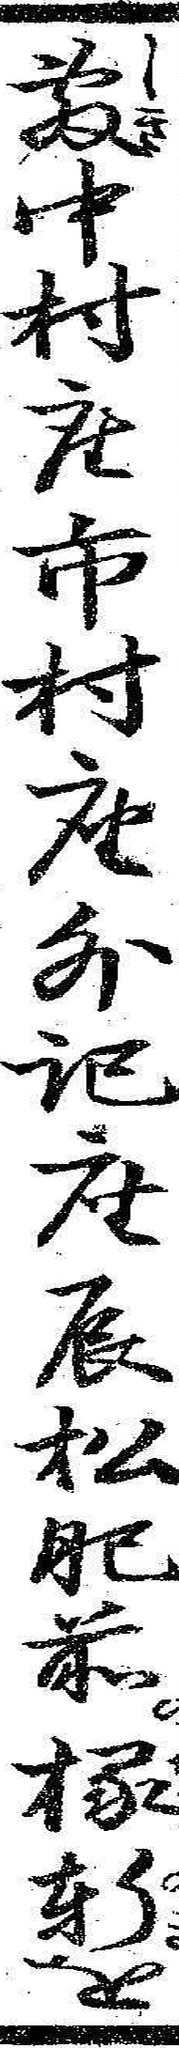敷中村座市村座外記座辰松肥前椂軒を
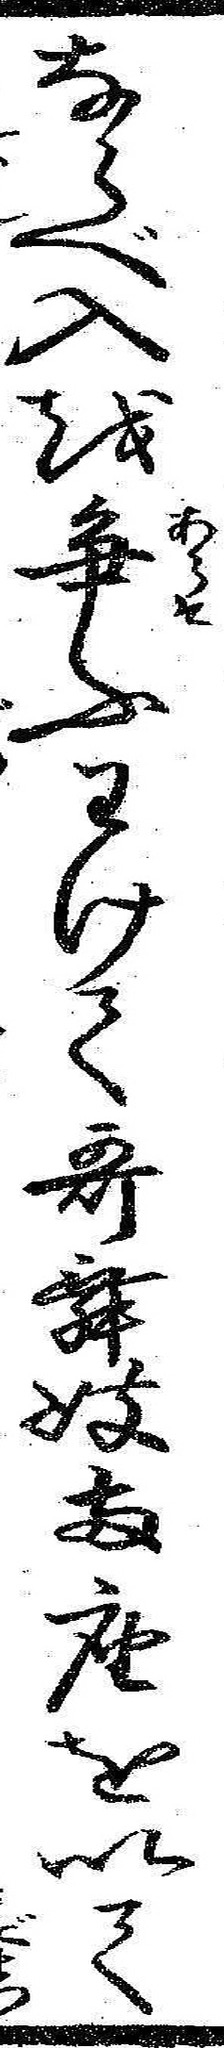ならべ入を争ふわけて哥舞妓両座を以て
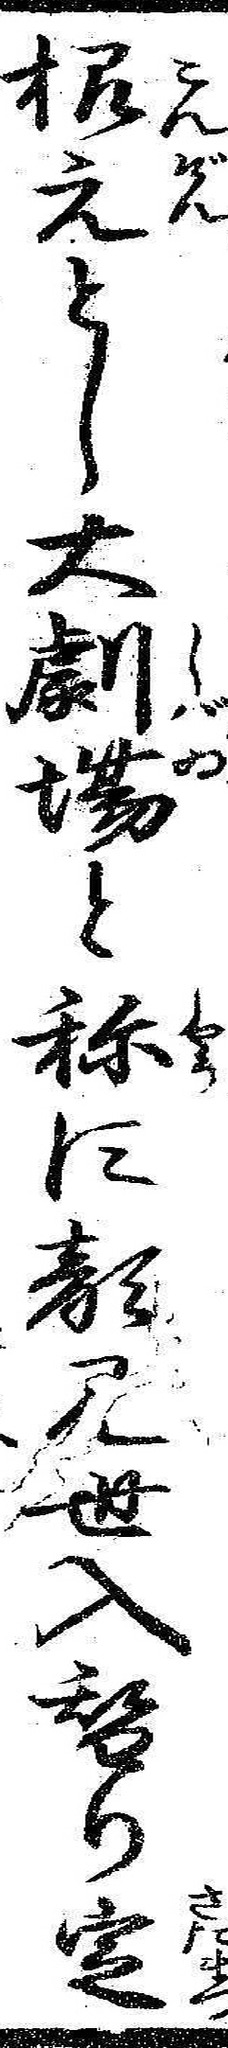根元とし大劇場と称す顔見世入替り定
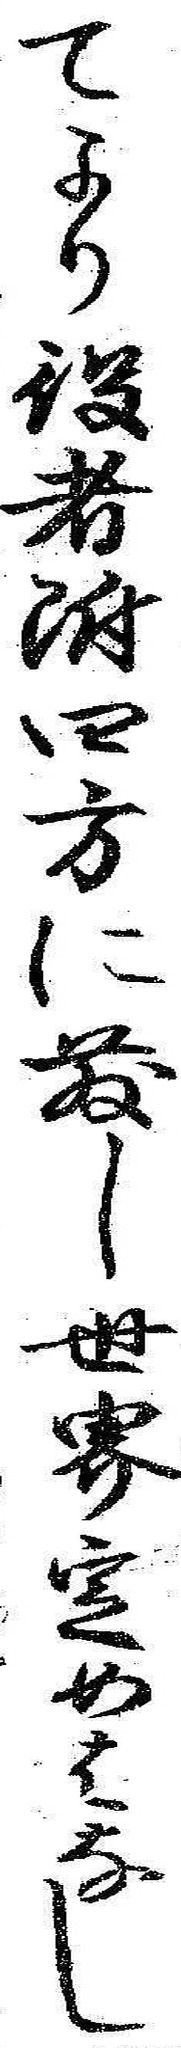てより役者附四方に散し世界定めはなし
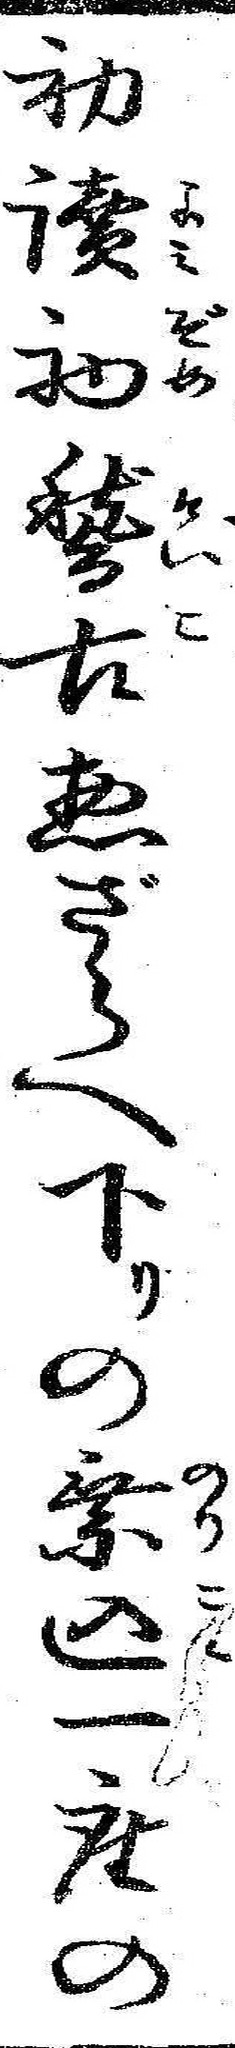初読初稽古惣ざらへ下乗込一座の
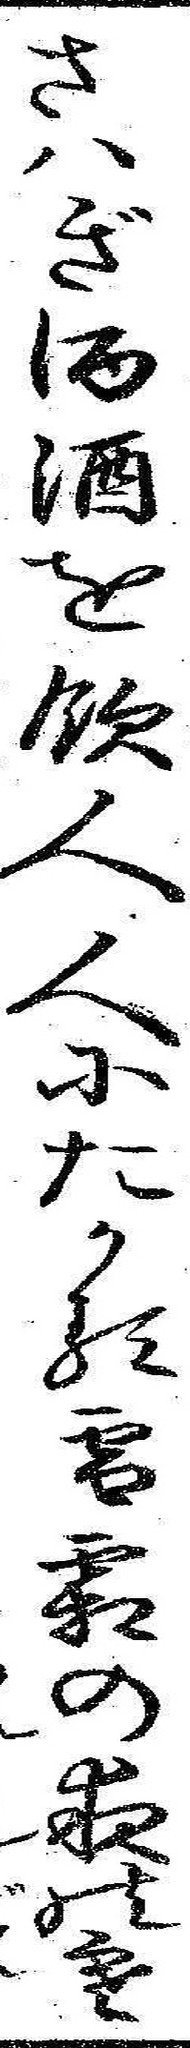さはぎ酒酒を飲人人にたかる雪霜の夜の寒
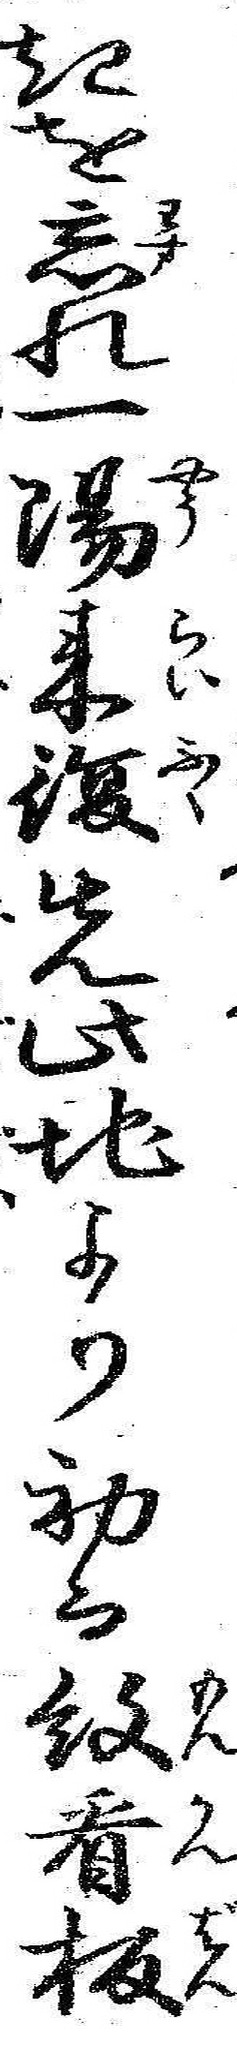きを忘れ一陽来復先此地より初る紋看板
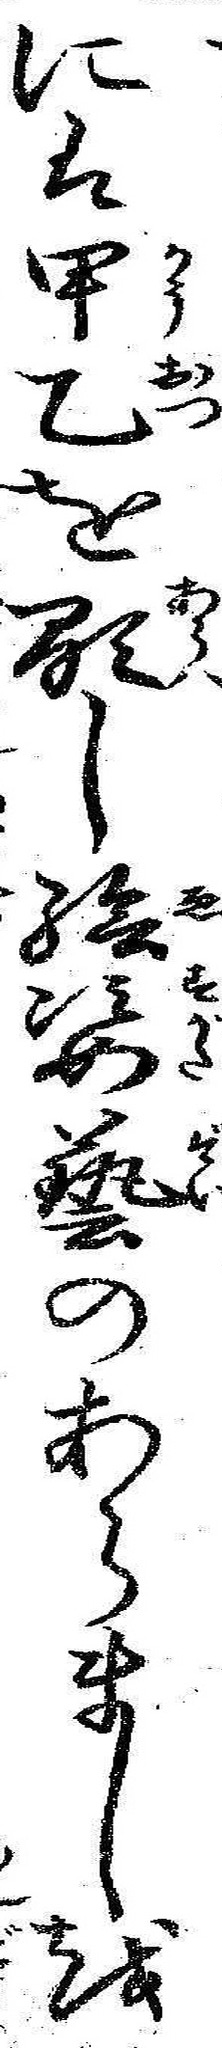には甲乙を顕し絵姿芸のあらましを
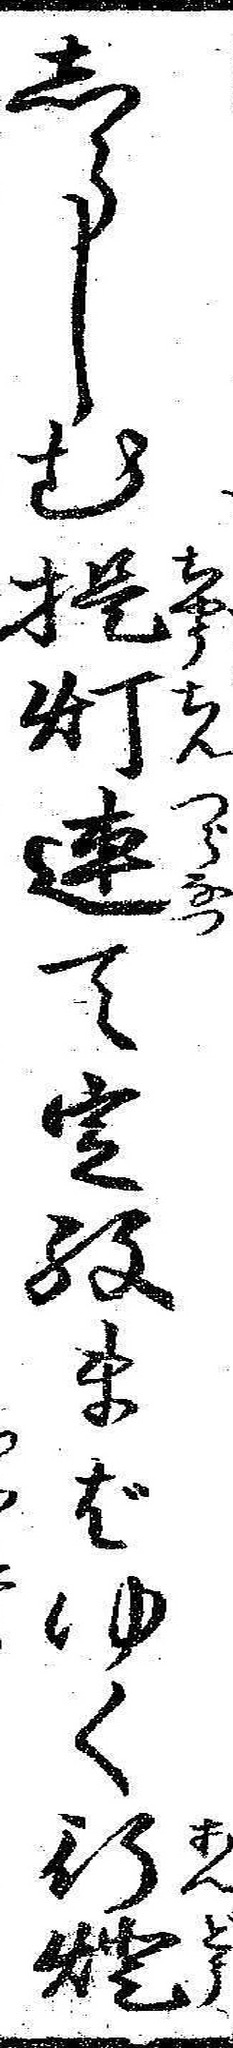しらしむ提灯連て定紋まばゆく行灯
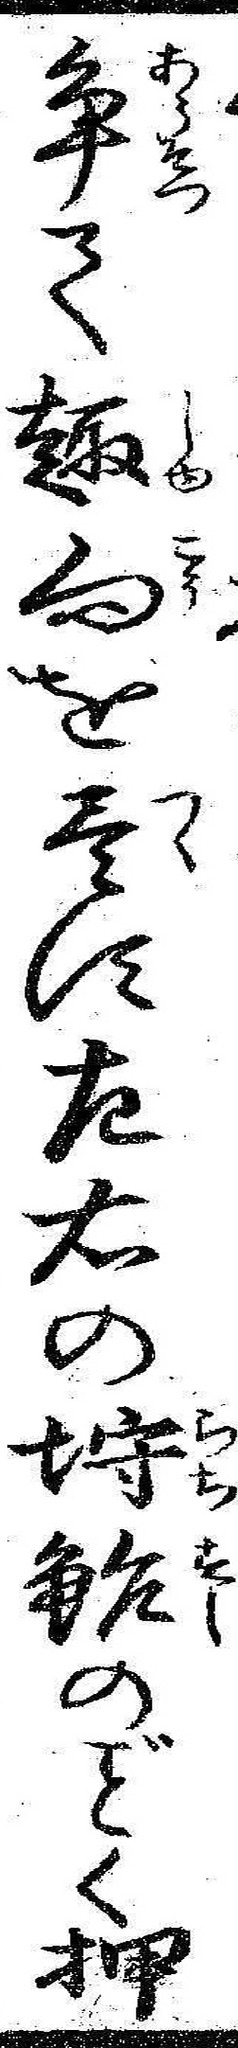争て趣向を尽す左右の埒鮓のごとく押

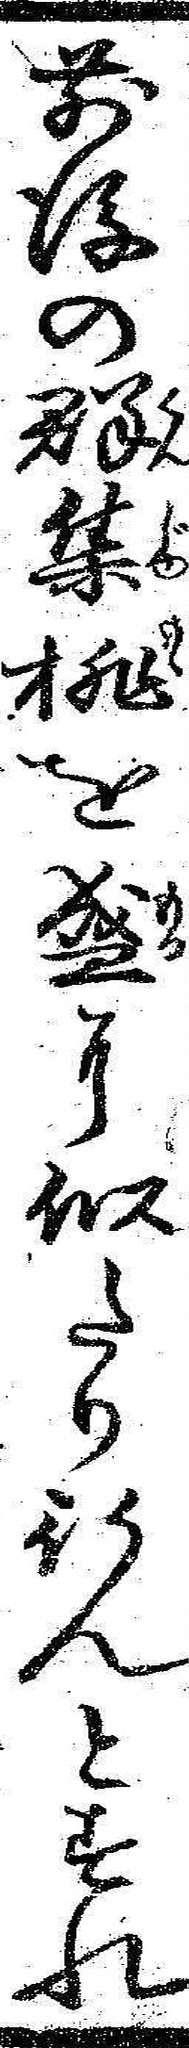前後の群集桃を盛に似たり行んとすれ
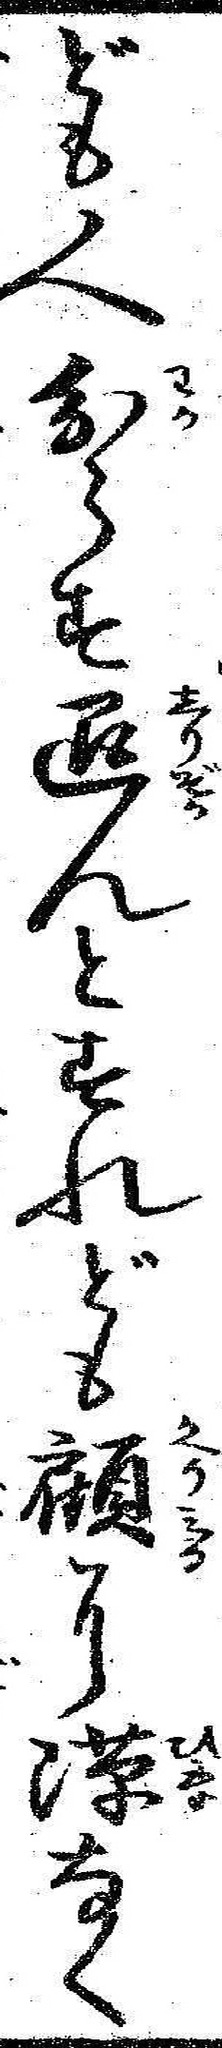ども人分らす退んとすれども顧に隙なく
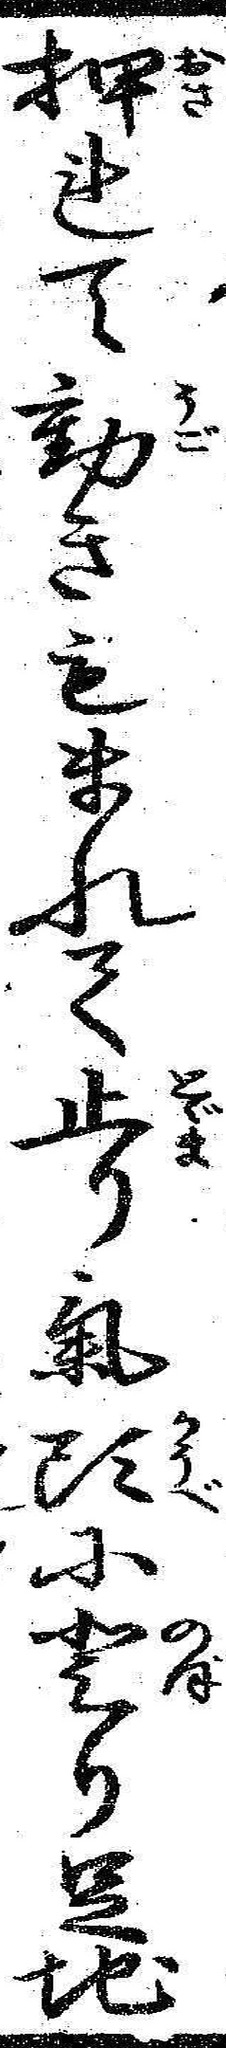押れて動きもまれて止り気頭に登り足地
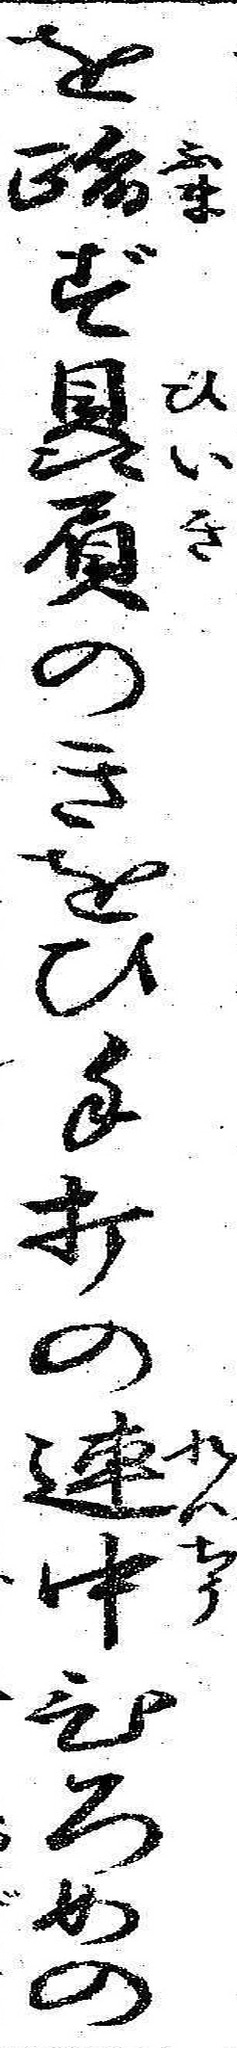を踏ず贔屓のきをひ手打の連中ひろめの
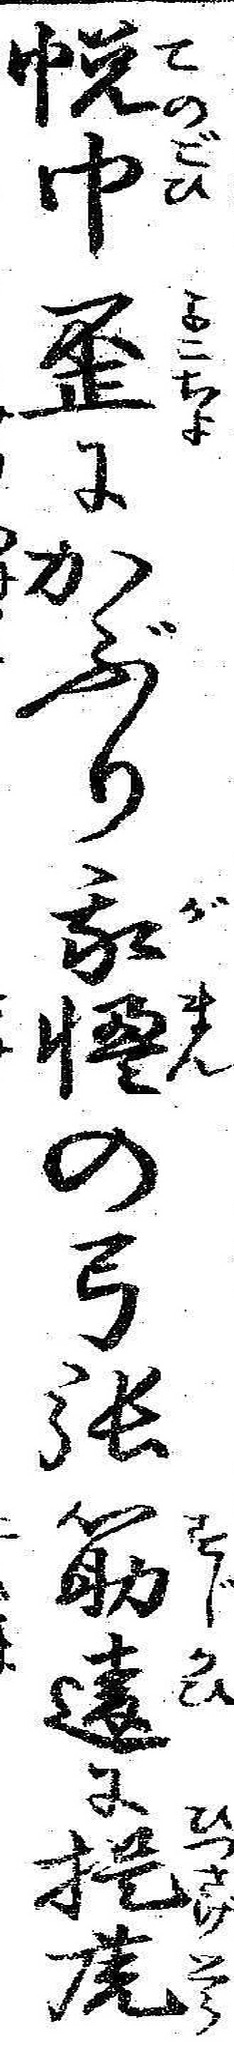悦巾歪にかぶり我慢の弓張筋違に提虎
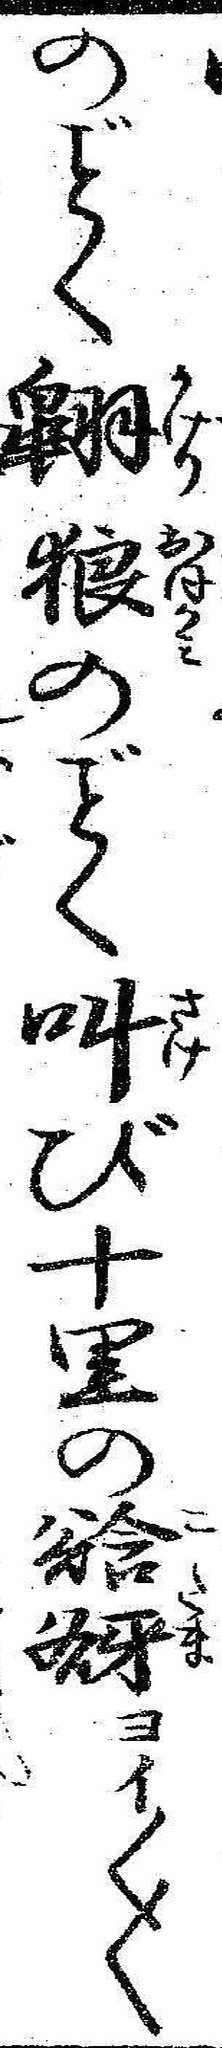のごとく翶狼のごとく叫び十里の谽谺〳〵〳〵
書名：根無草後編
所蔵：国文学研究資料館
